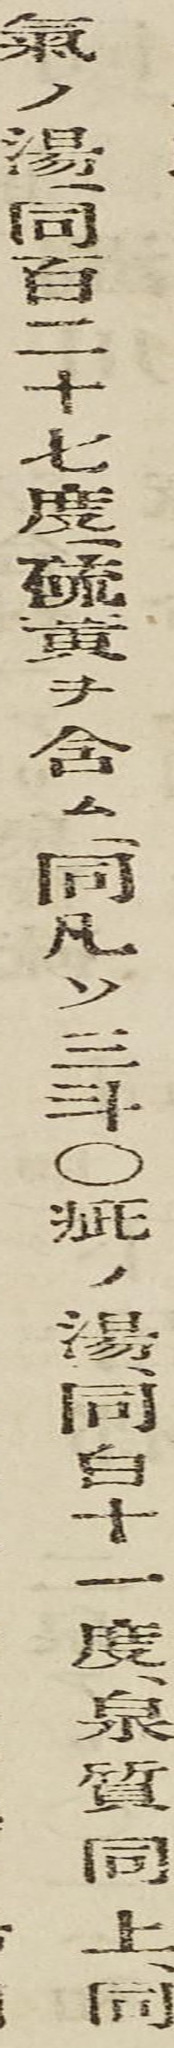気ノ湯、同百二十七度、硫黄ヲ含ム、同凡ソ三斗○疵ノ湯、同百十一度、泉質同上、同
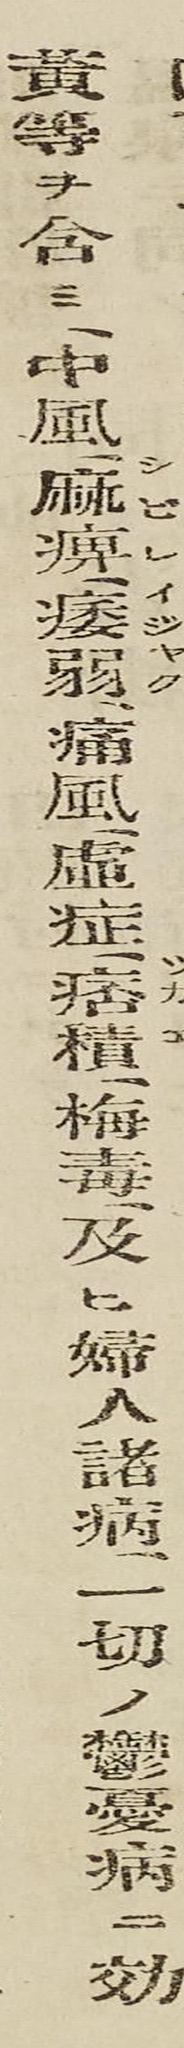黄等ヲ含ミ、中風、痲痺、痿弱、痛風、虚症、痞積、梅毒、及ヒ婦人諸病、一切ノ鬱憂病ニ効
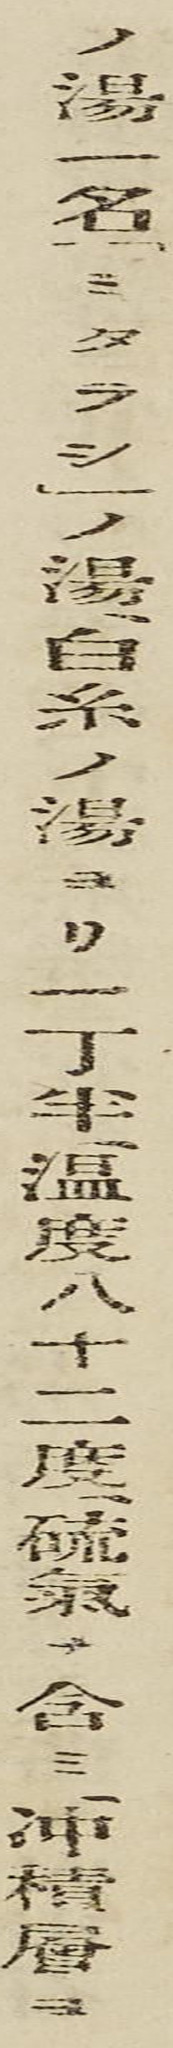ノ湯一名「ミタラシ」ノ湯、白糸ノ湯ヨリ一丁半、温度八十二度、硫気ヲ含ミ、冲積層ヨ
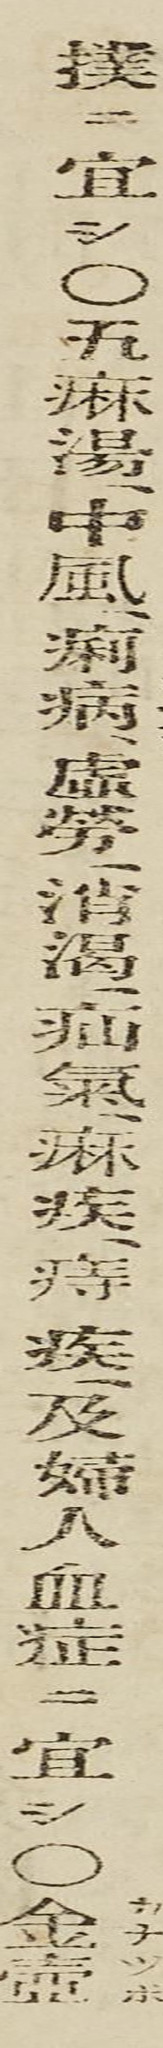撲ニ宣シ○五痳湯、中風、痢病、虚労、消渇、疝気、痳疾、痔疾、及婦人血症ニ宣シ○金壺

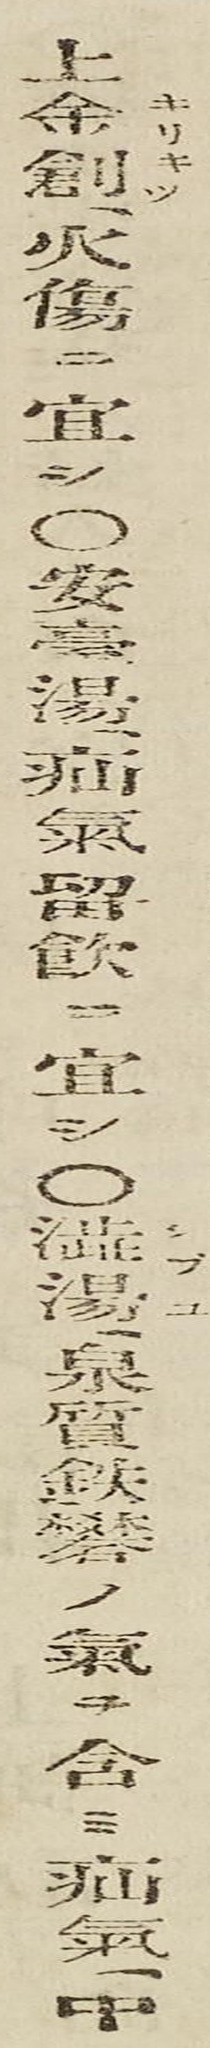上金創、火傷ニ宣シ○安湯、疝気留飲ニ宣シ、○渋湯、泉質鉄礬ノ気ヲ含ミ疝気、中
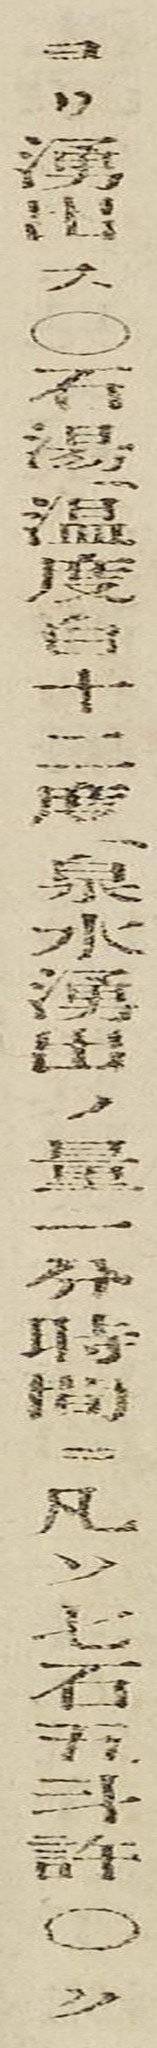ヨリ湧出ス○石湯、温度百十二度、泉水湧出ノ量一分時間ニ凡ソ七石五斗許○ク
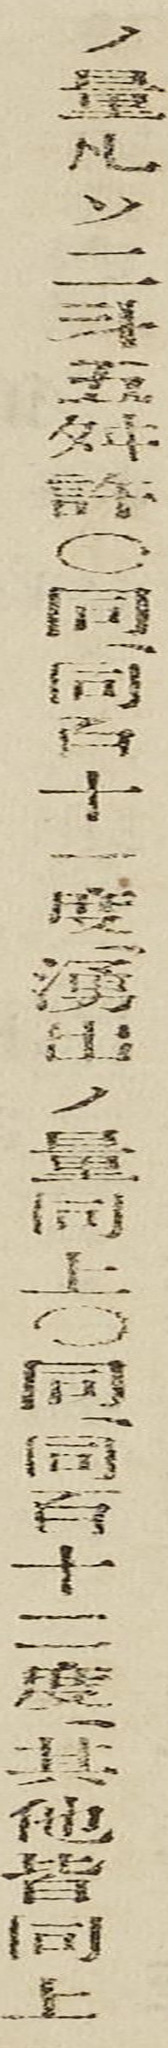ノ量凡ソ二斗五升許○同、同百十一度、湧出ノ量同上○同、同百十二度、其他皆同上
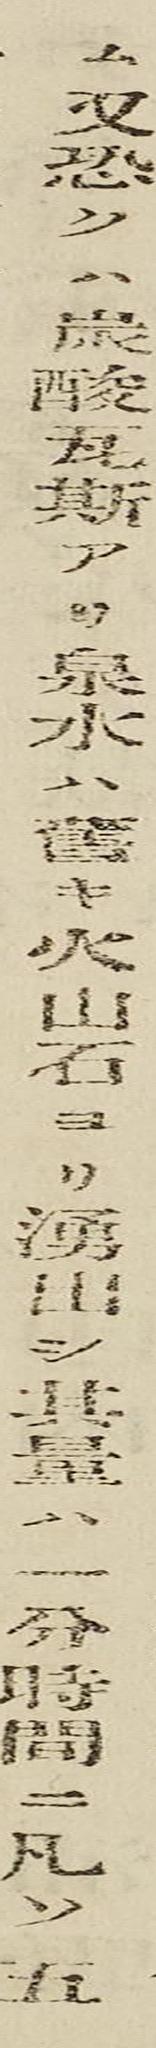ム又恐クハ炭酸瓦斯アリ泉水ハ旧キ火山石ヨリ湧出シ其量ハ一分時間ニ凡ソ五
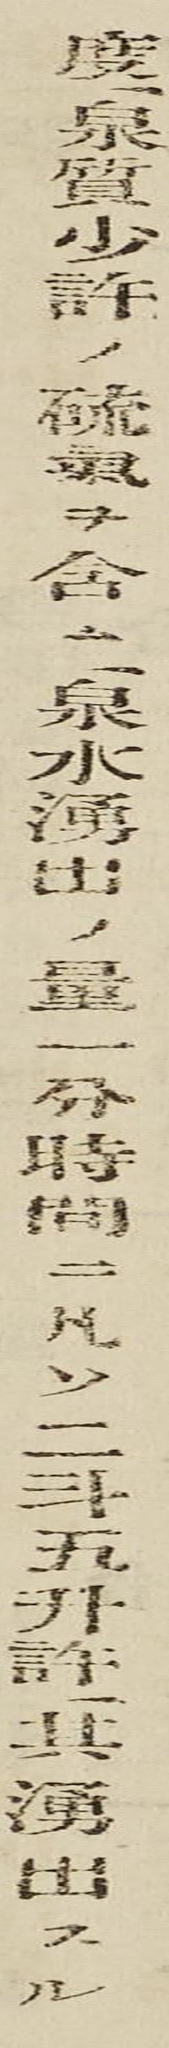度、泉質少許ノ硫気ヲ含ム、泉水湧出ノ量一分時間ニ凡ソ二斗五升許、其湧出スル

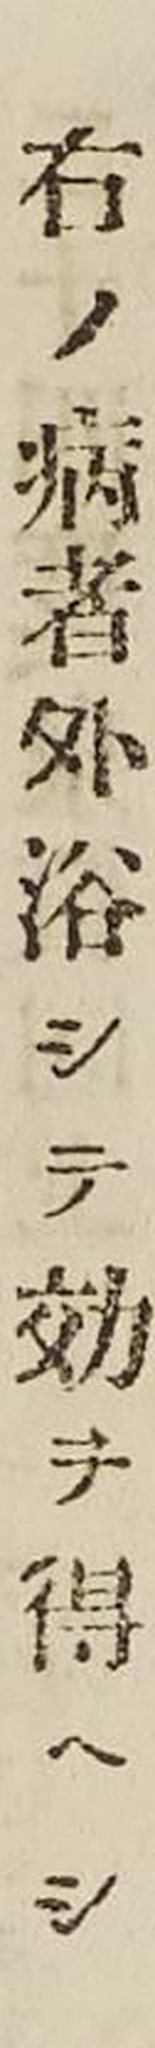右ノ病者外浴シテ効ヲ得ヘシ

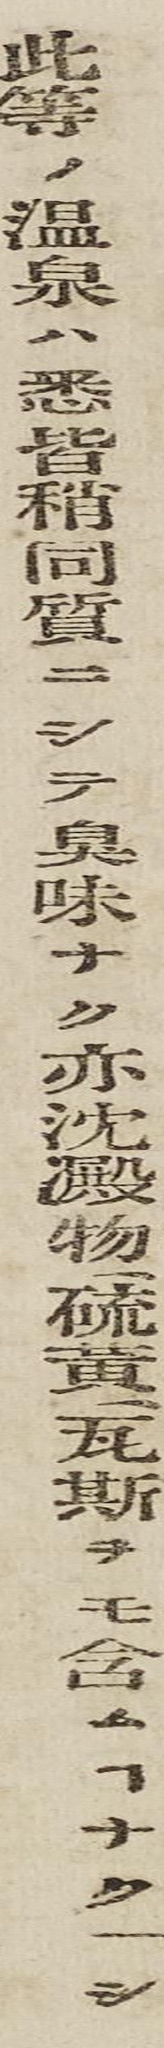此等ノ温泉ハ悉皆稍同質ニシテ臭味ナク亦沈殿物、硫黄、瓦斯ヲモ含ムコトナク「シ

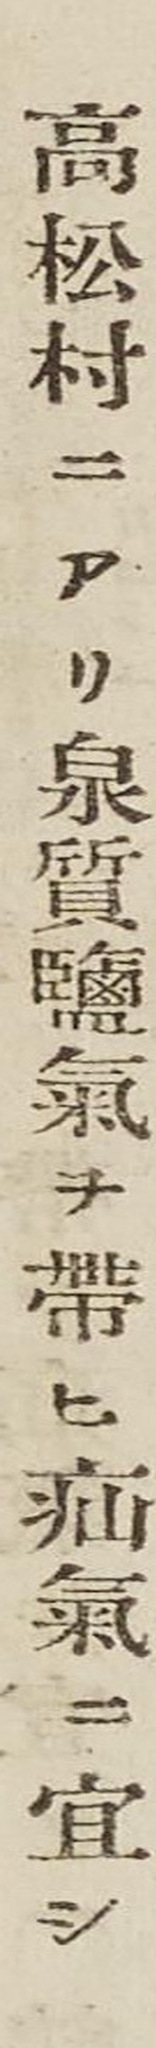湯畑等村ニアリ泉質塩気ヲ含ミ疝気ニ宣シ
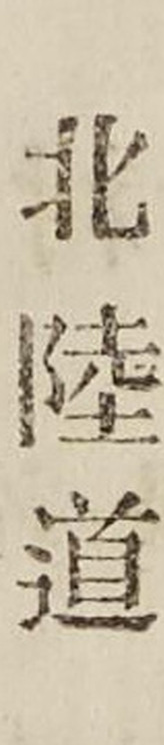北陸道

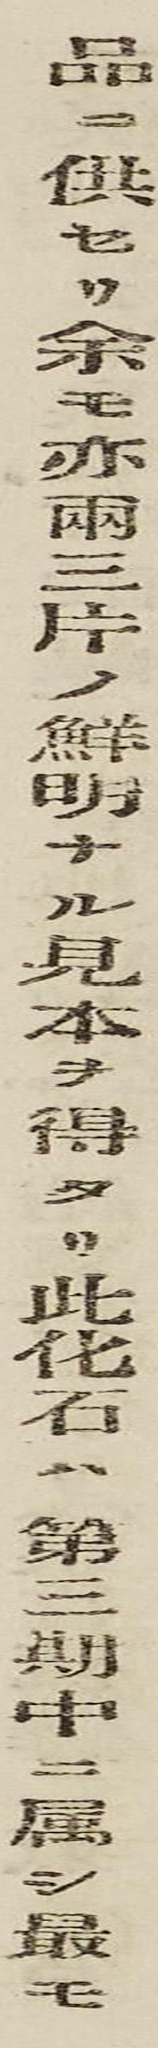品ニ供セリ余モ亦両三片ノ鮮明ナル見本ヲ得タリ此化石ハ第三期中ニ属シ最モ

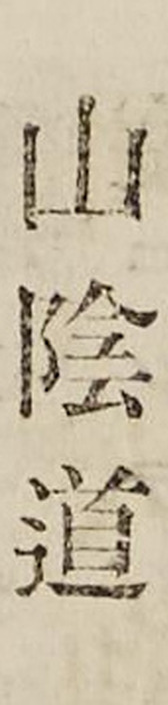山陰道

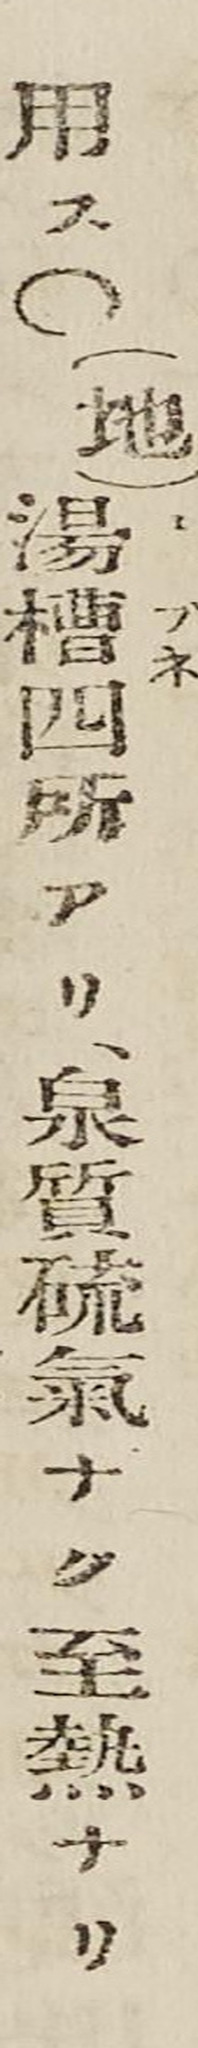用ス○湯槽四所アリ、泉質硫気ナク至熱ナリ
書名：日本温泉考
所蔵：東京大学地震研究所図書室 Earthquake Research Institute Library, The University of Tokyo, JAPAN
